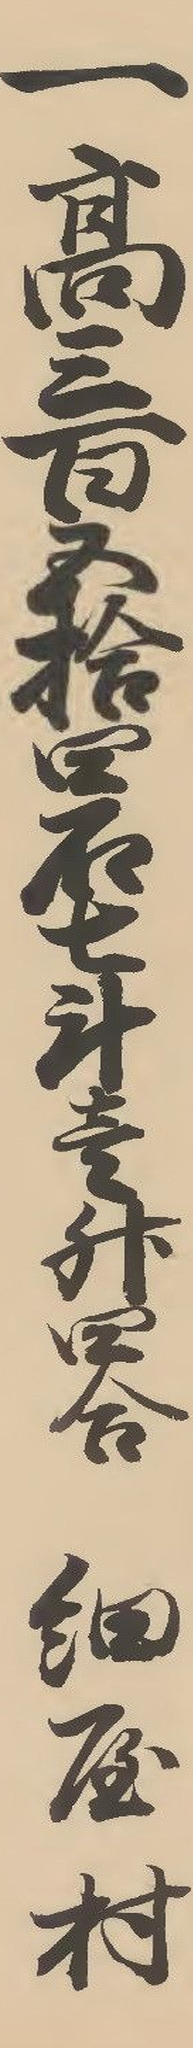一高三百五拾四石七斗壱升四合細屋村
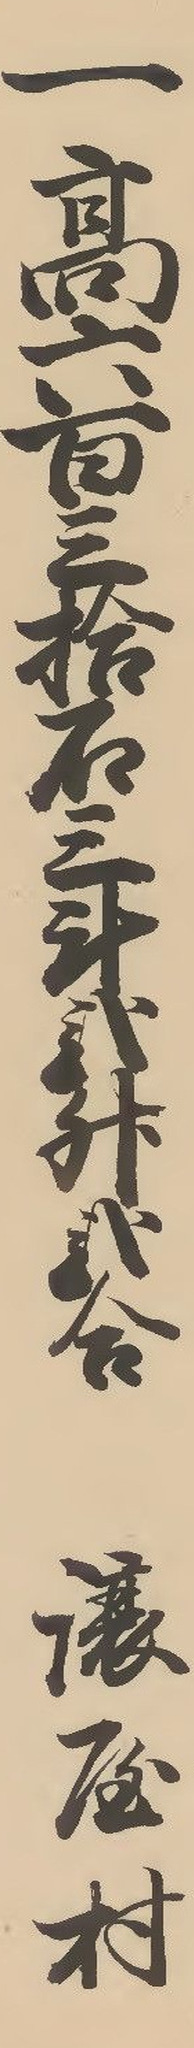一高六百三拾石三斗弐升弐合譲屋村
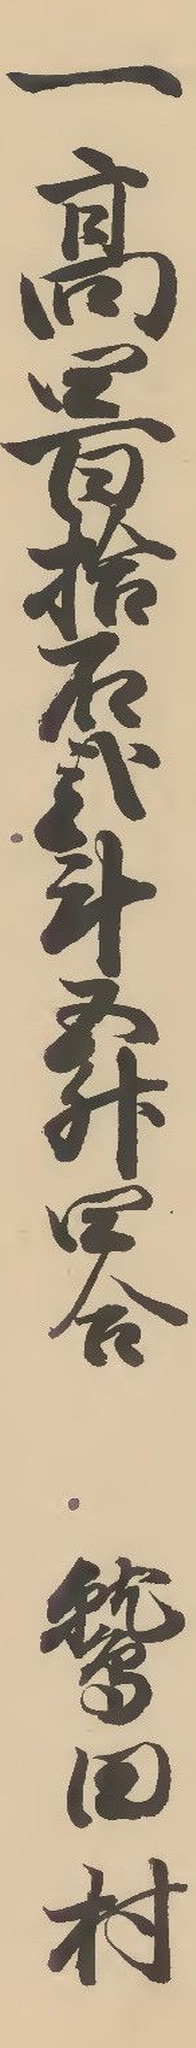一高四百拾石弐斗五升四合鷲田村

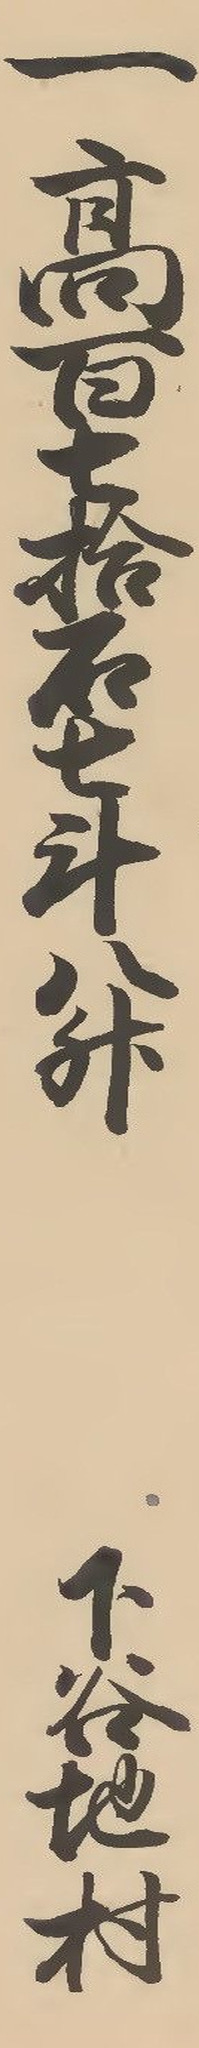一高百七拾石七斗八升下谷地村
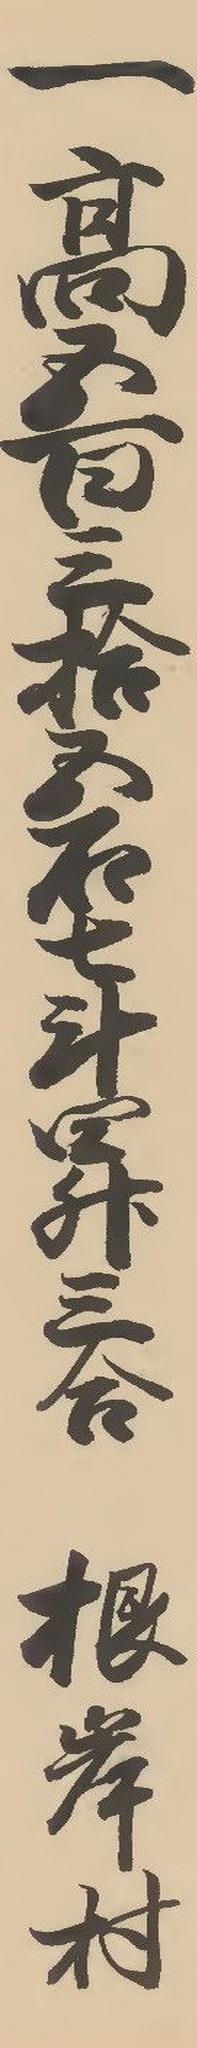一高五百三拾五石七斗四升三合根岸村
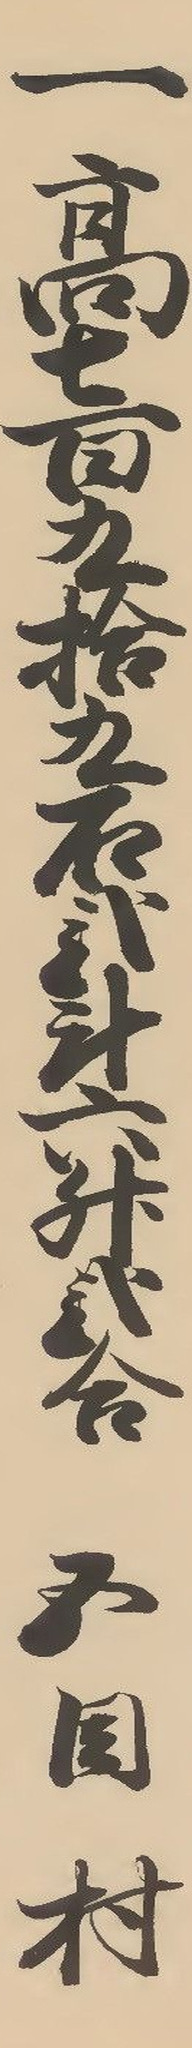一高七百九拾九石弐斗六升弐合五目村
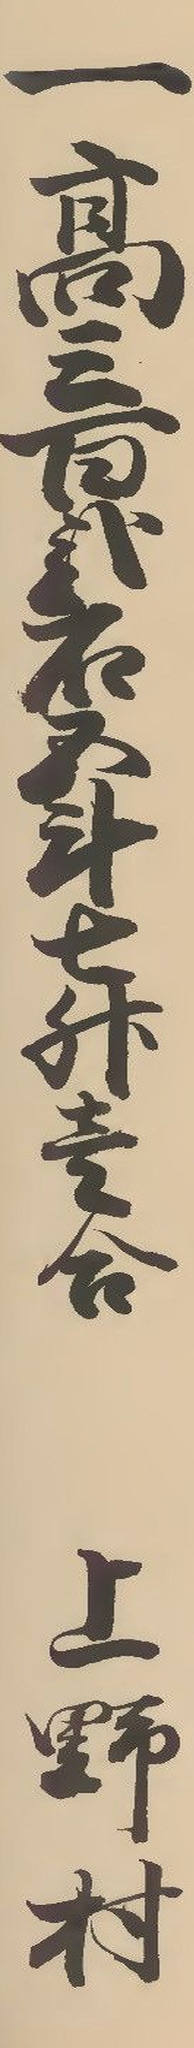一高三百弐石五斗七升壱合上野村
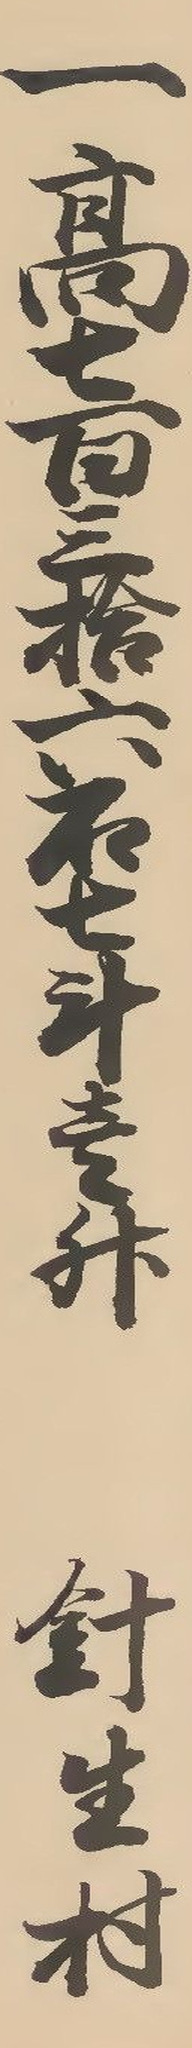一高七百三拾六石七斗壱升針生村
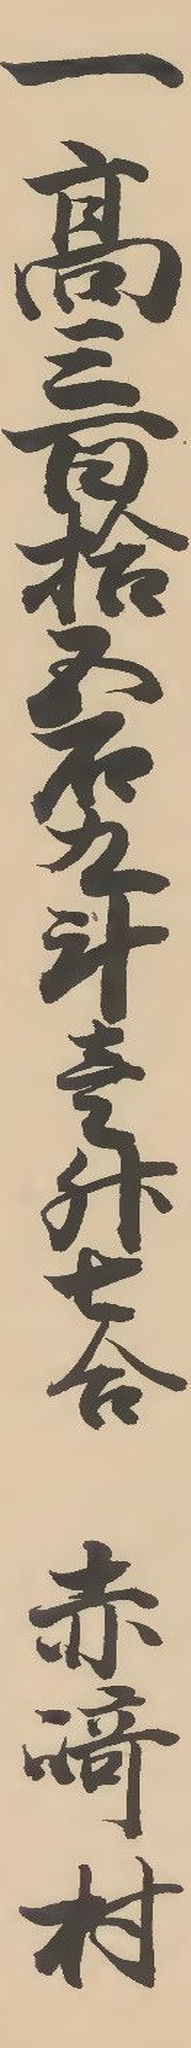一高三百拾五石九斗壱升七合赤崎村
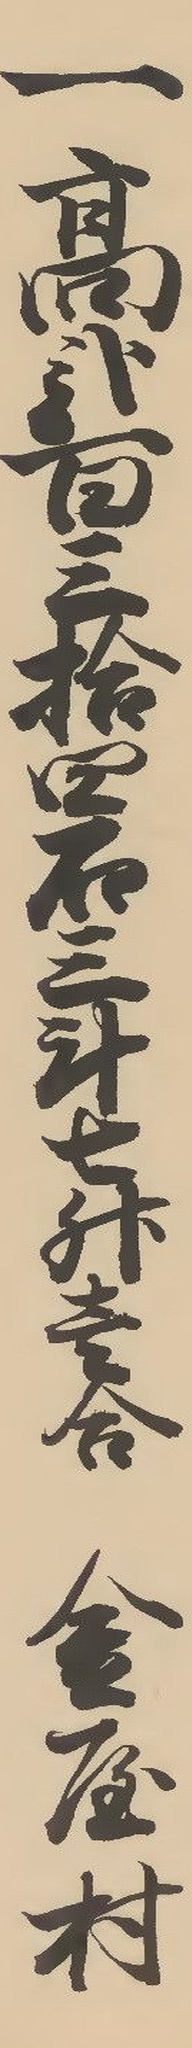一高弐百三拾四石三斗七升壱合金屋村
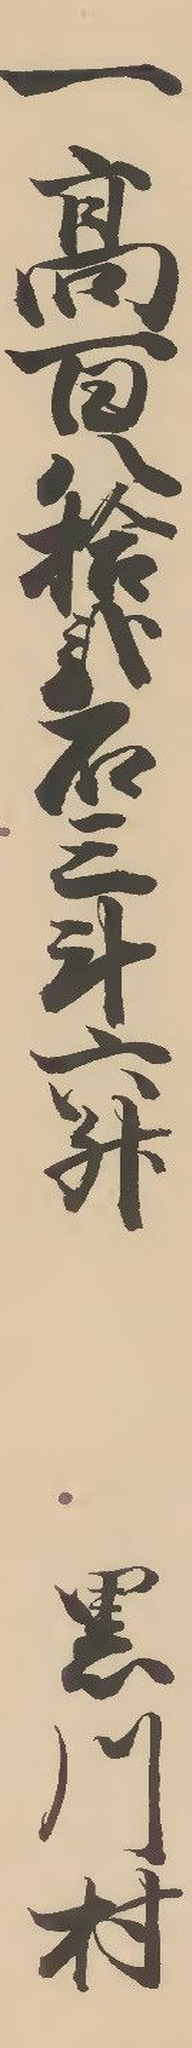一高百八拾弐石三斗六升黒川村

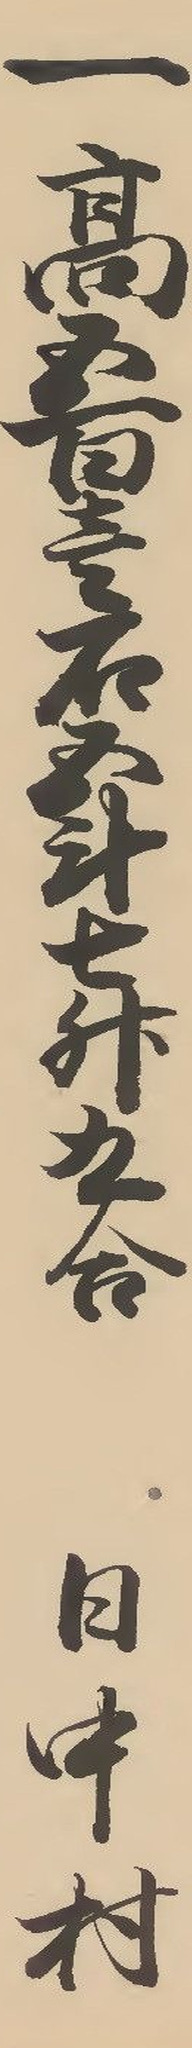一高五百壱石五斗七升九合日中村
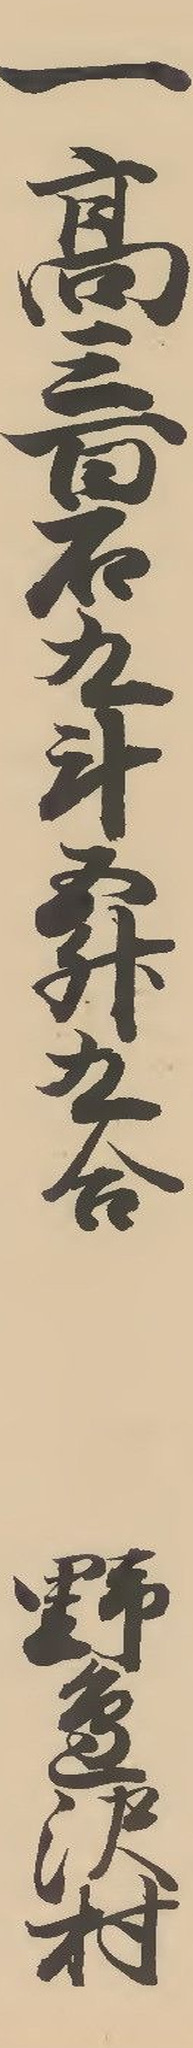一高三百石九斗五升九合野辺沢村
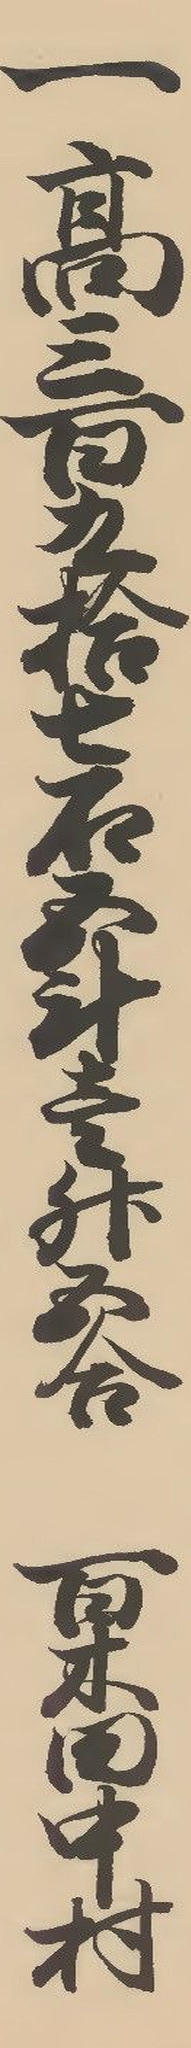一高三百九拾七石五斗壱升五合百木田中村
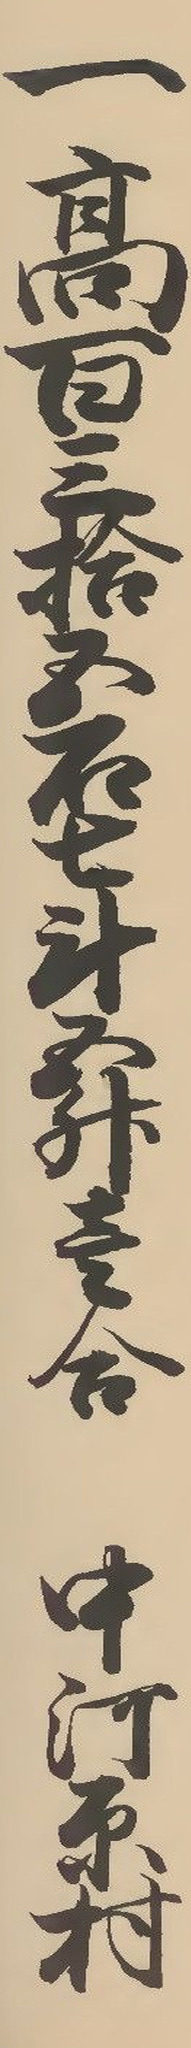一高百三拾五石七斗五升壱合中河原村
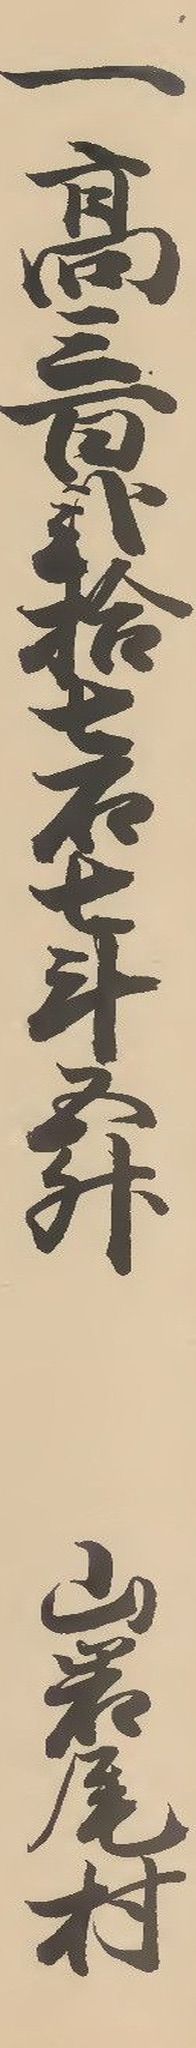一高三百弐拾七石七斗五升山岩尾村
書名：陸奥国郷帳　１
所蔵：国立公文書館 National Archives of Japan
